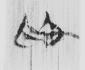爲
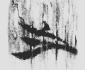之
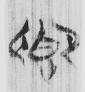卿
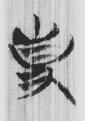事
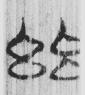𢆶
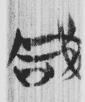咸
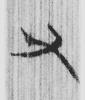又
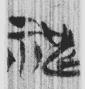神
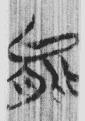能
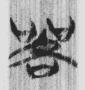{吅各}
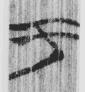于
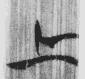上
